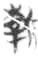新
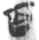百
